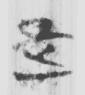是
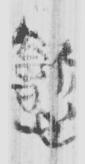{仌言斤心}
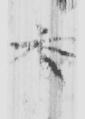夫
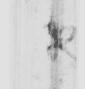四
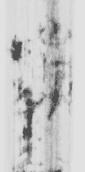{木甫}
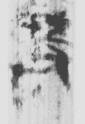卑
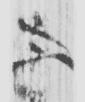之
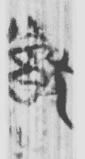猶
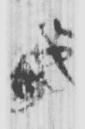{月 歺}
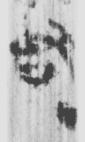厷
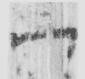一
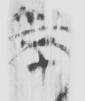不
